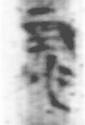彔（綠）
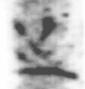之
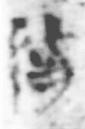紫
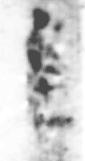○（錦）
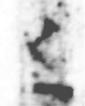之
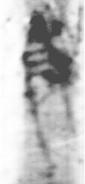兼
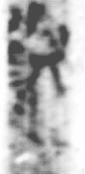○（豻）
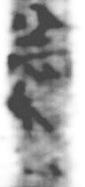常
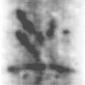之
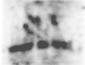之
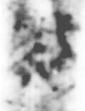紫
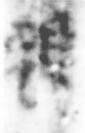因（絪）
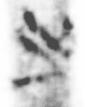之
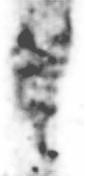○（席）
